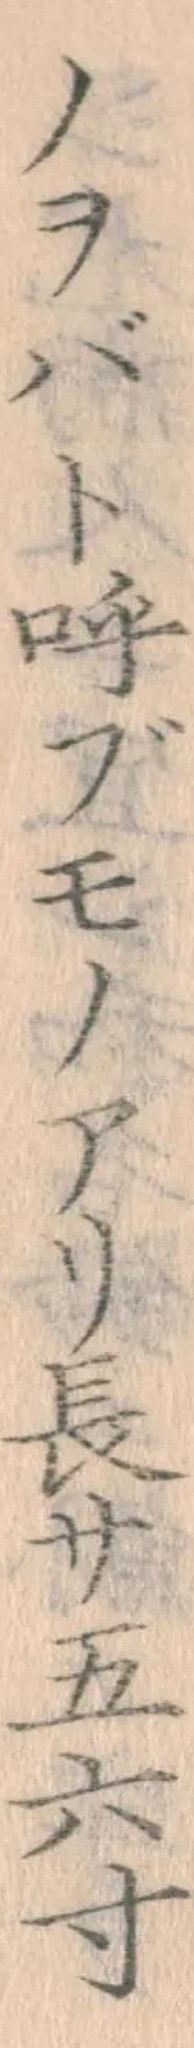ノヲバト呼ブモノアリ長サ五六寸
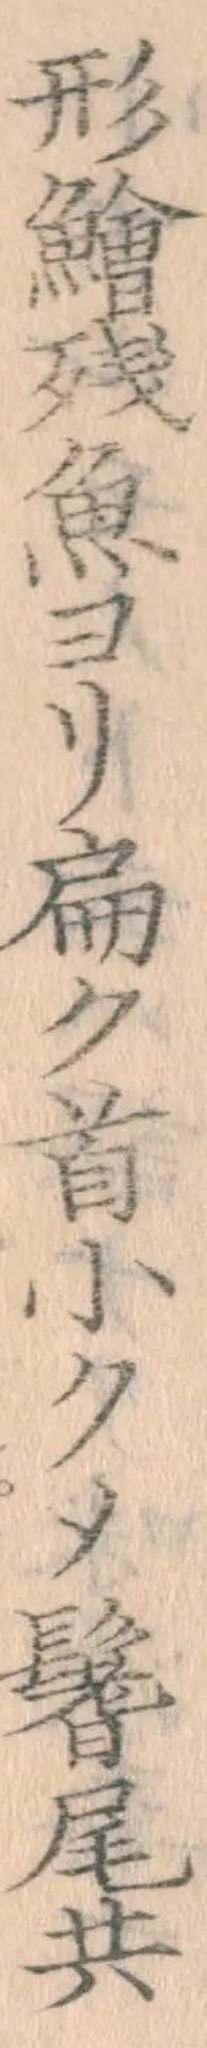形鱠残魚ヨリ扁ク首小クシテ鬐尾共
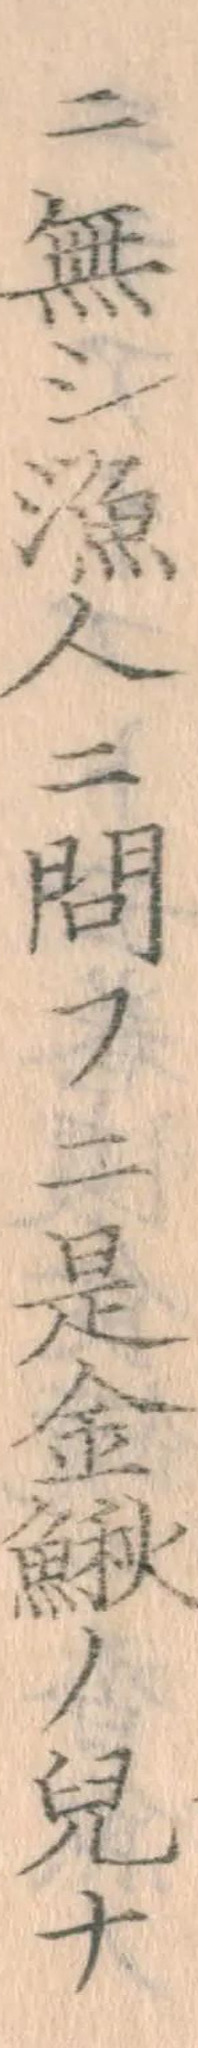ニ無シ漁人ニ問フニ是金鰍ノ児ナ
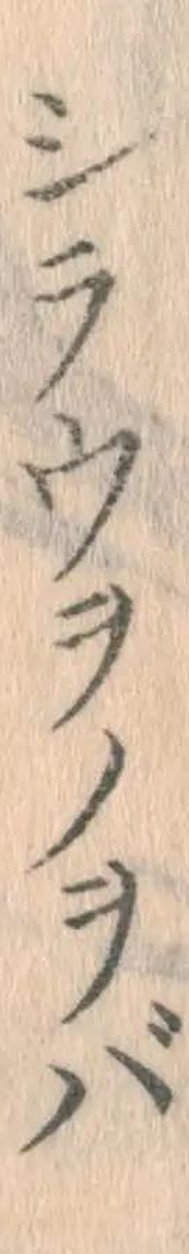シウヲノヲバ
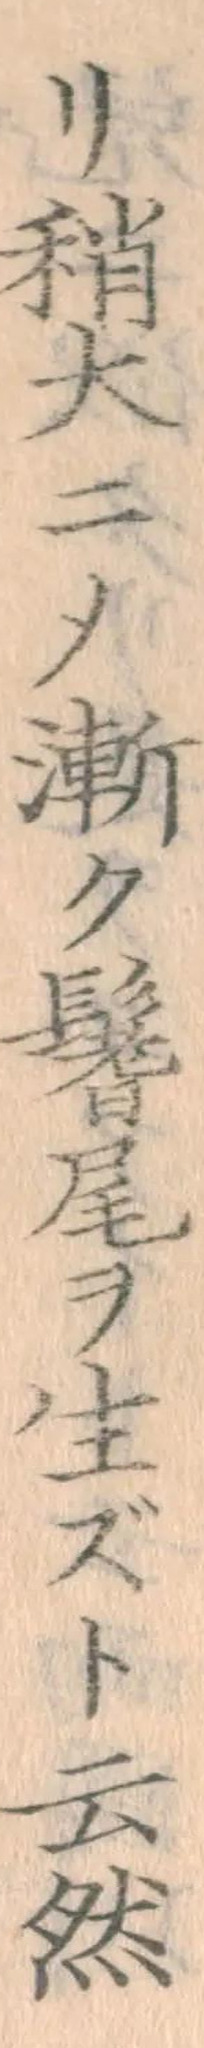リ稍大ニシテ漸ク鬐尾ヲ生ズト云然
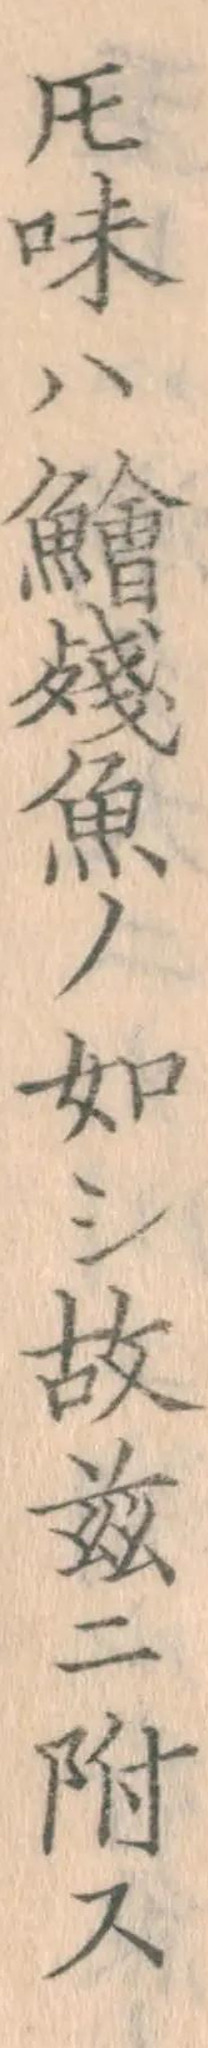トモ味ハ鱠残魚ノ如シ故茲ニ附ス
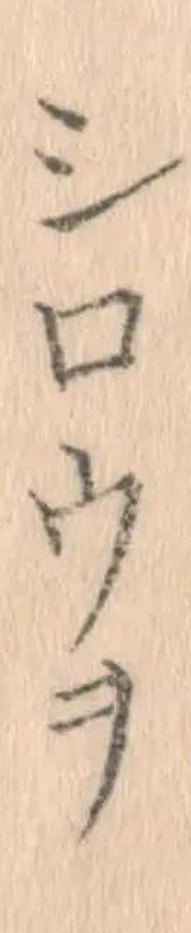シラウヲ

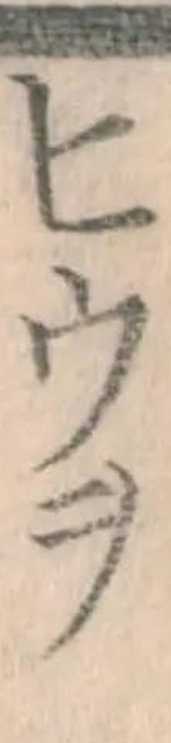ヒウヲ
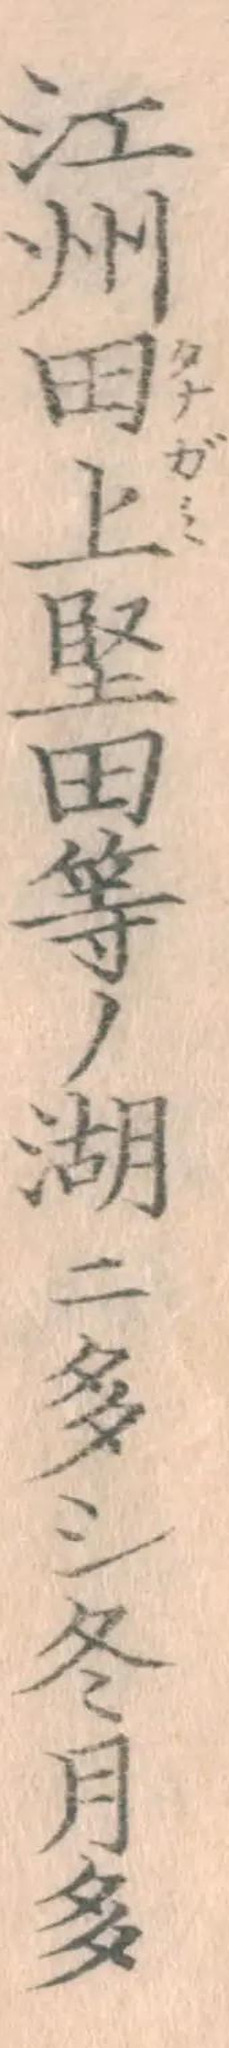江州田上堅田等ノ湖ニ多シ冬月多
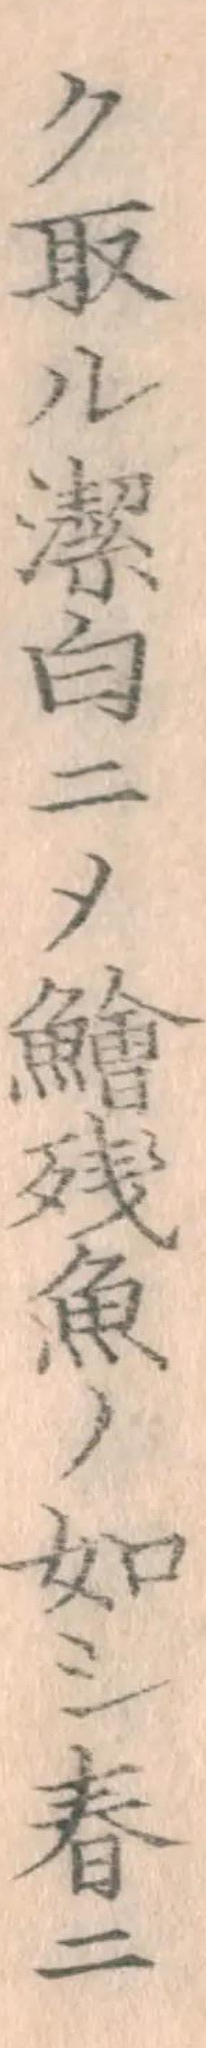ク取ル潔白ニシテ鱠残魚ノ如シ春ニ
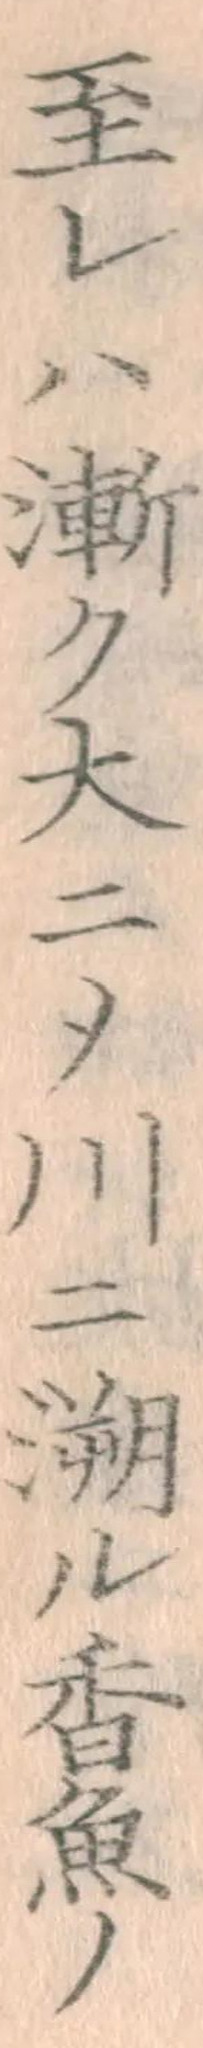至レハ漸ク大ニシテ川ニ溯ル香魚ノ
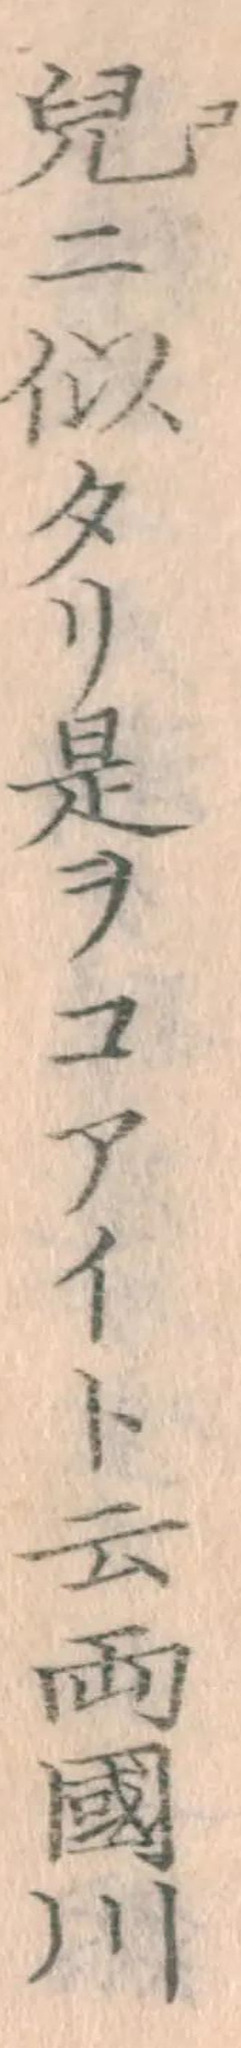児ニ似タリ是ヲコアイト云両国川
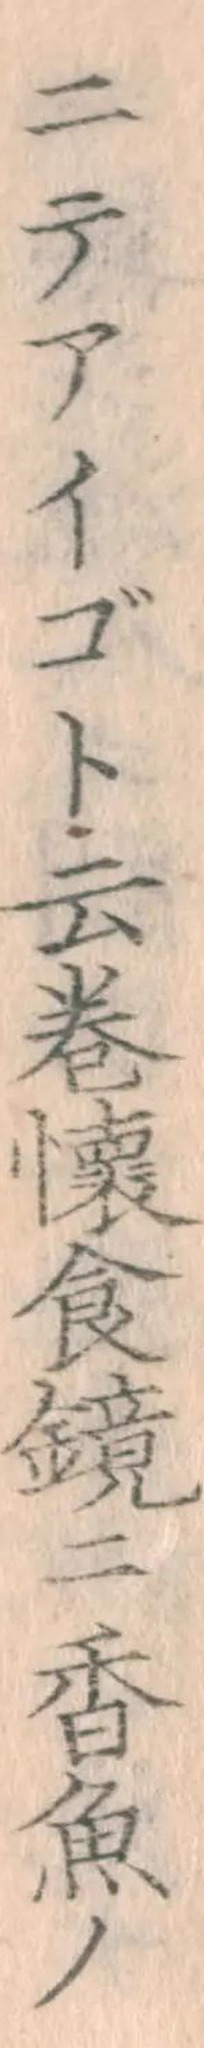ニテアイゴト云巻懐食鏡ニ香魚ノ
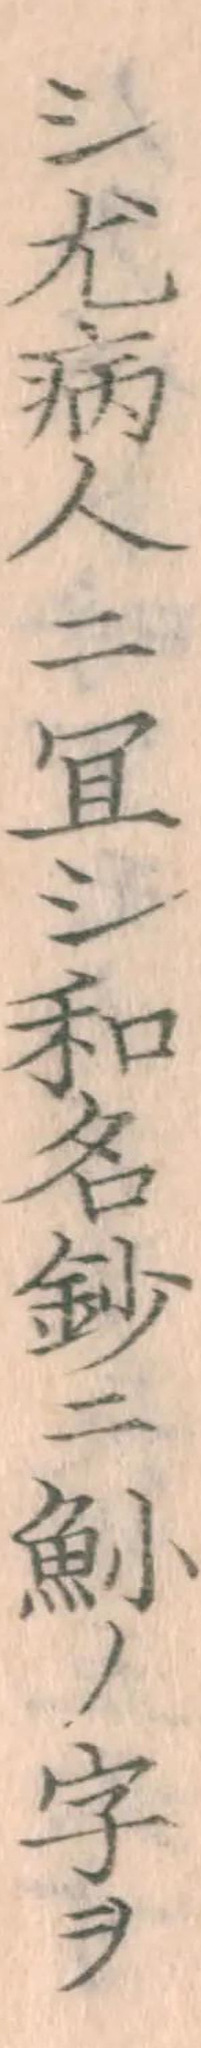シ尤病人ニ宜シ和名鈔ニノ字ヲ
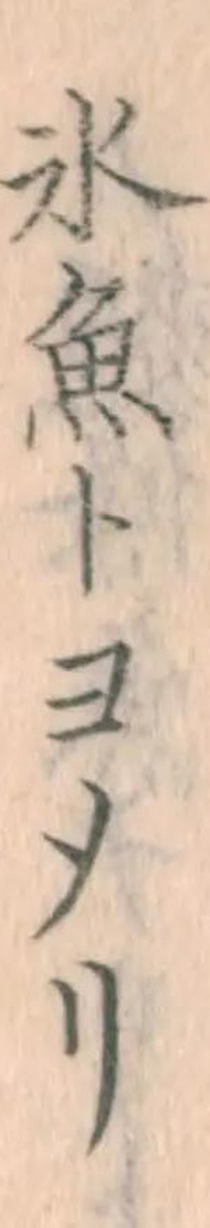氷魚トヨメリ
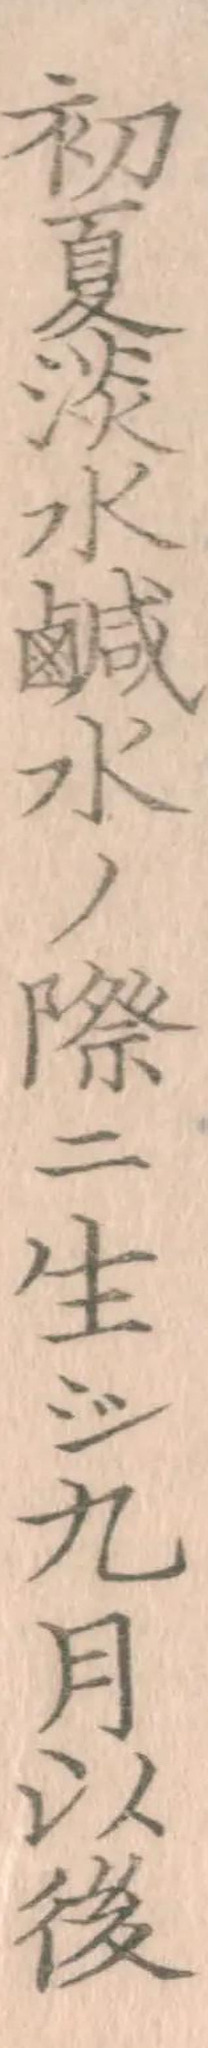初夏淡水鹹水ノ際ニ生ジ九月以後
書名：皇和魚譜 2巻
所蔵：国立国会図書館 National Diet Library, JAPAN
